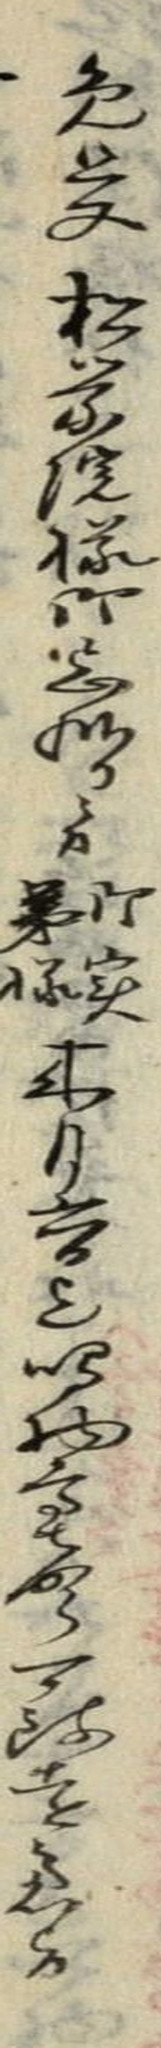免且又松栄院様御忌掛りに付御実弟様来月六日迄鳴物高声可致遠慮旨
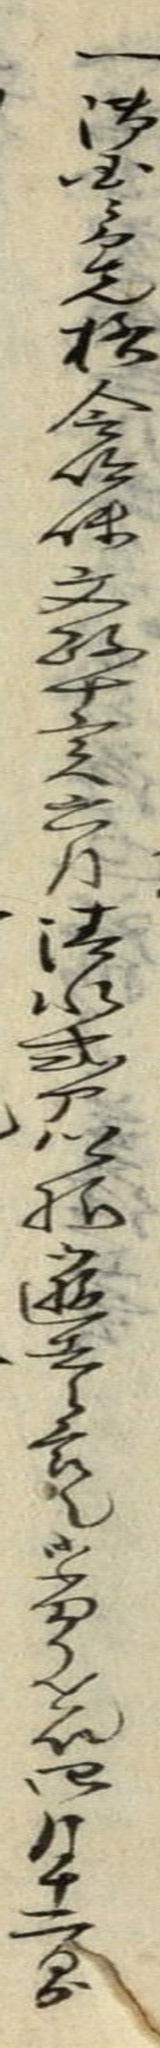一御国にて先格令吟味文政十亥六月清水式部卿様御逝去之節之御当りを以四月十二日ゟ
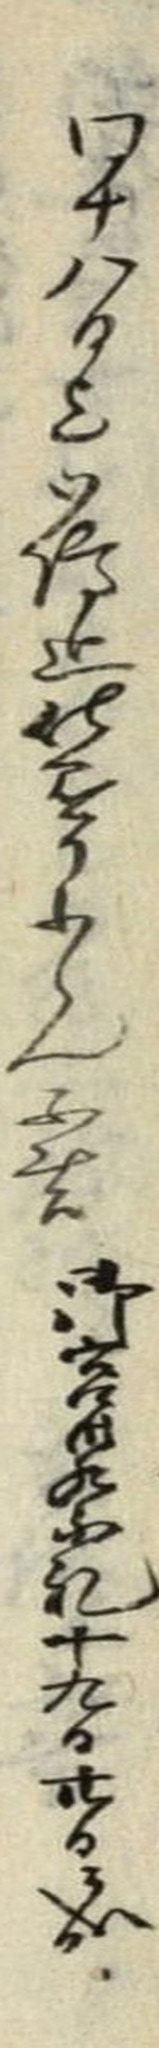同十八日迄御停止仕懸りふしん不苦御宮御祭礼十九日廿日に成
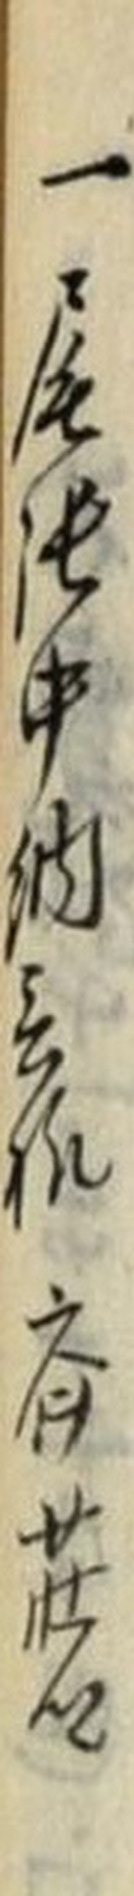一尾張中納言様斉荘卿
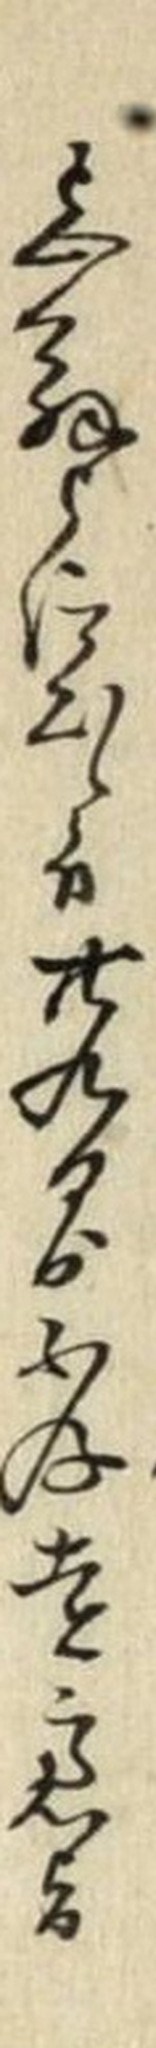忌解被仰出候に付廿九日ゟ不及遠慮旨
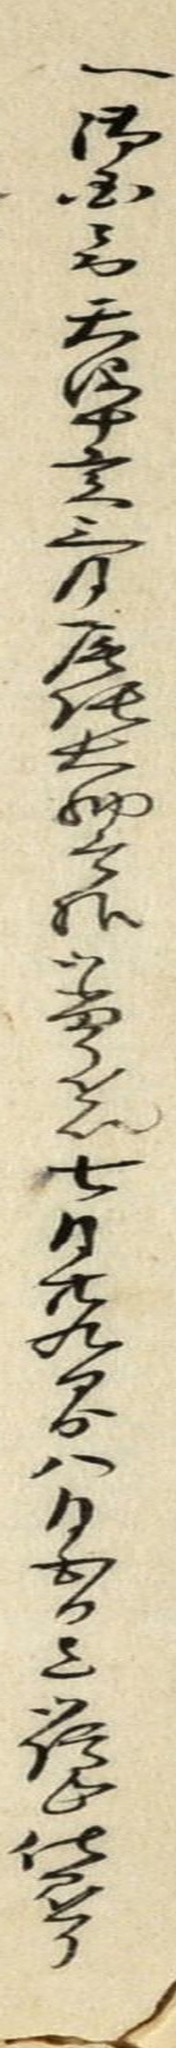一御国にて天保十亥三月尾張大納言様御当りを以七月廿九日ゟ八月五日迄御停止仕懸り
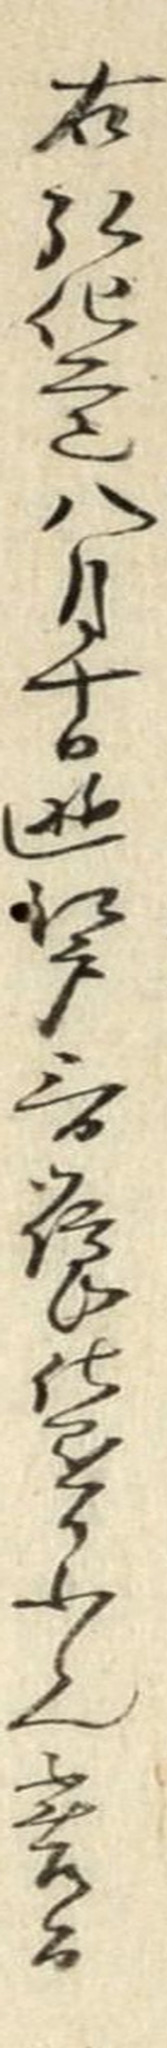右弘化二巳八月十日逝江戸三日御停止仕懸りふしん不苦旨
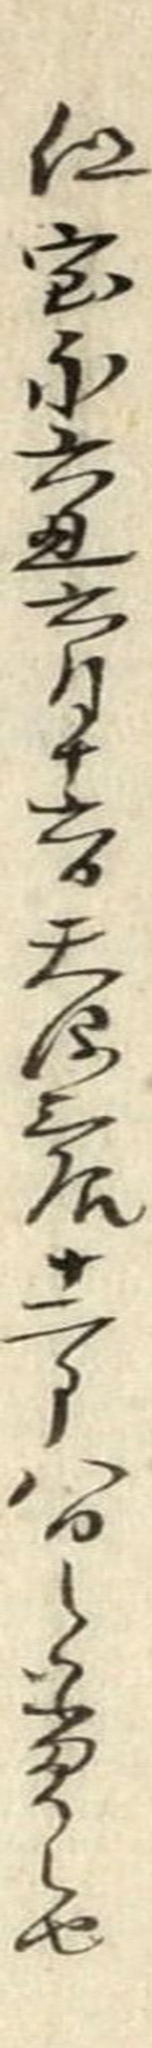但宝永六丑六月十六日天保三辰十二月八日之御当り之由
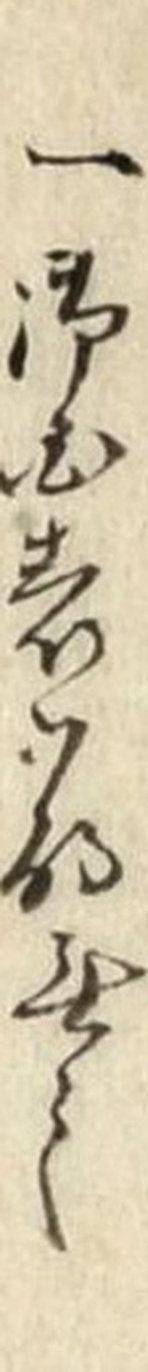一御国表御触無之
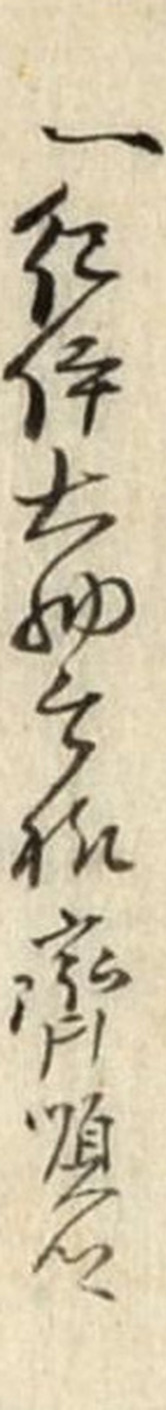一紀伊大納言様斉順卿
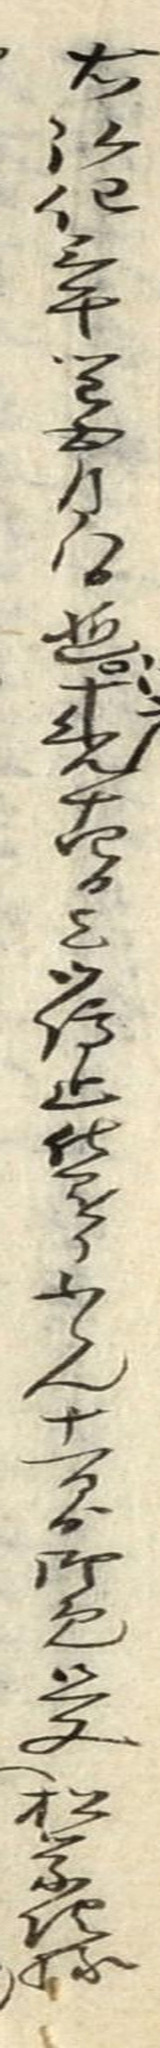右弘化三午閏五月八日逝◦江戸来ル十四日迄御停止仕懸りふしん十一日ゟ御免且又松栄院様実御兄様也
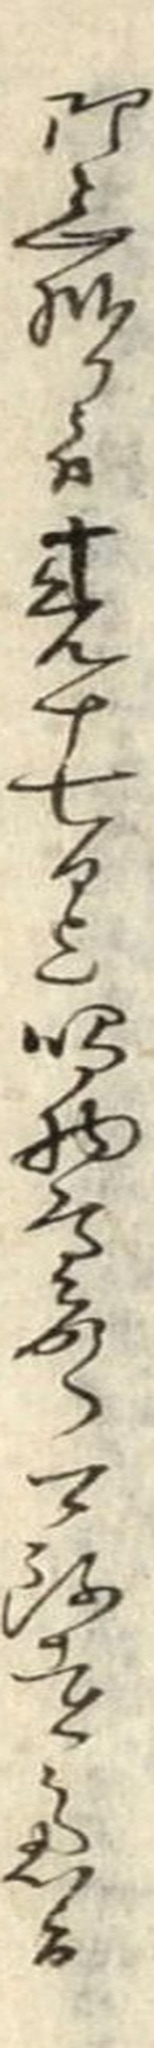御忌掛りに付来ル十七日迄鳴物高声可致遠慮旨
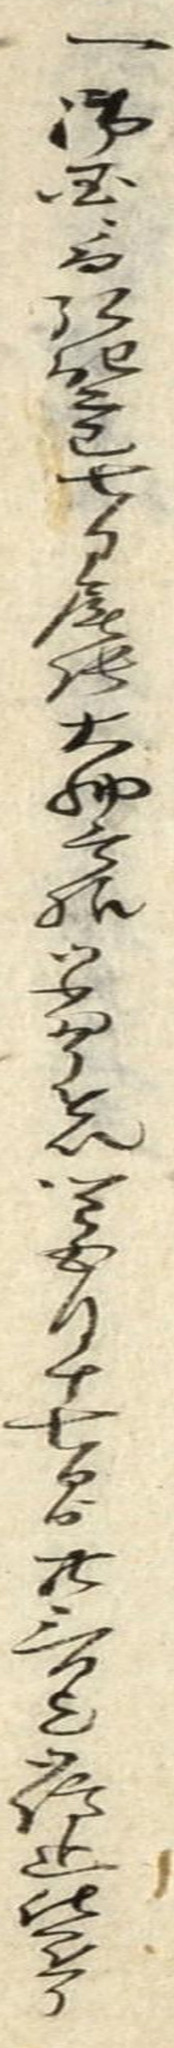一御国にて弘化二巳七月尾張大納言様御当りを以閏五月十七日ゟ廿三日迄御停止仕懸り
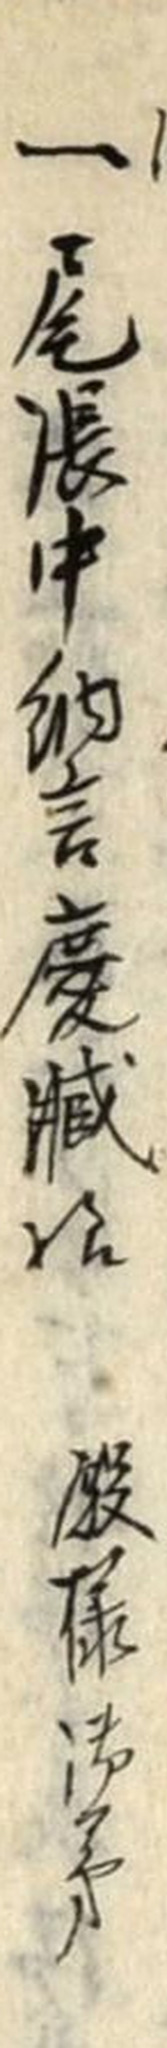一尾張中納言慶臧様殿様御弟
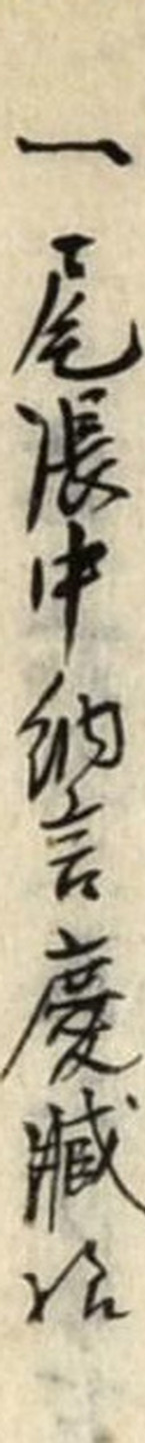一尾張中納言様斉荘卿

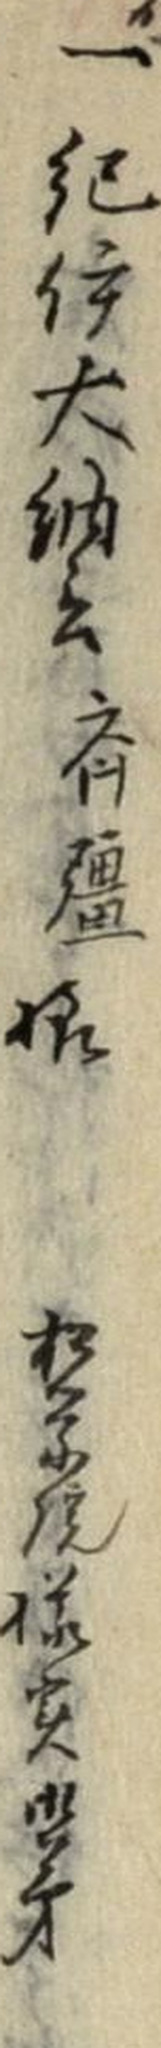一紀伊大納言斉彊様松栄院様実御弟
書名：御停止異変死失
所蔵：福井県文書館 Fukui Prefectural Archives
